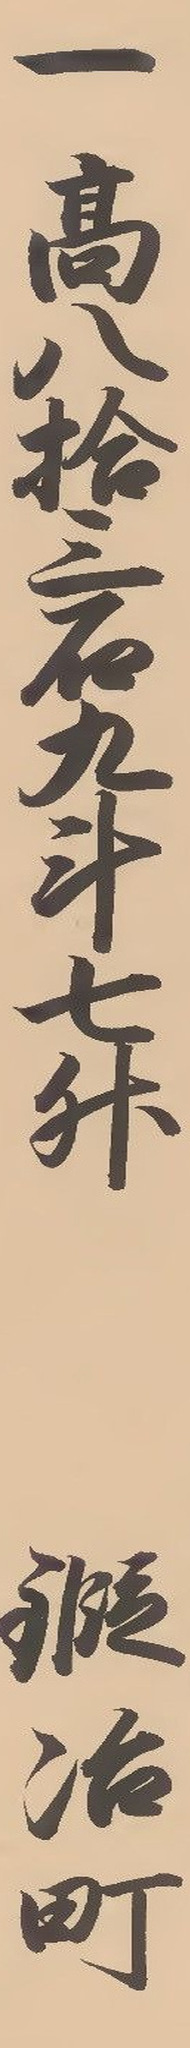一高八拾三石九斗七升鍛冶町
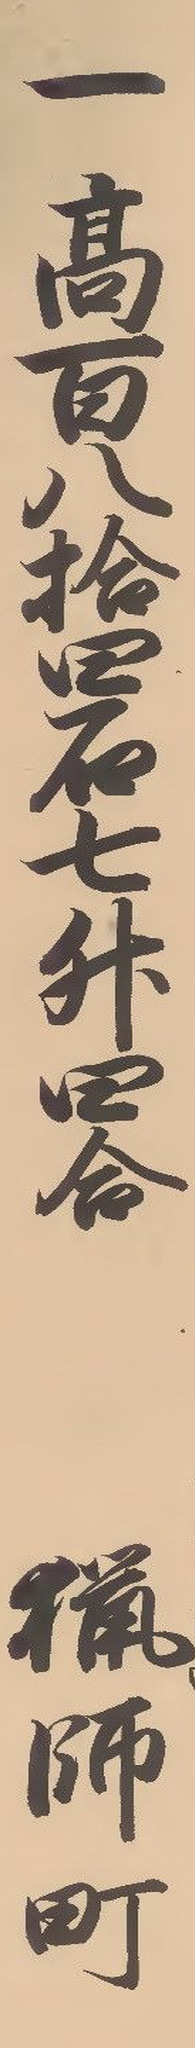一高百八拾四石七升四合猟師町

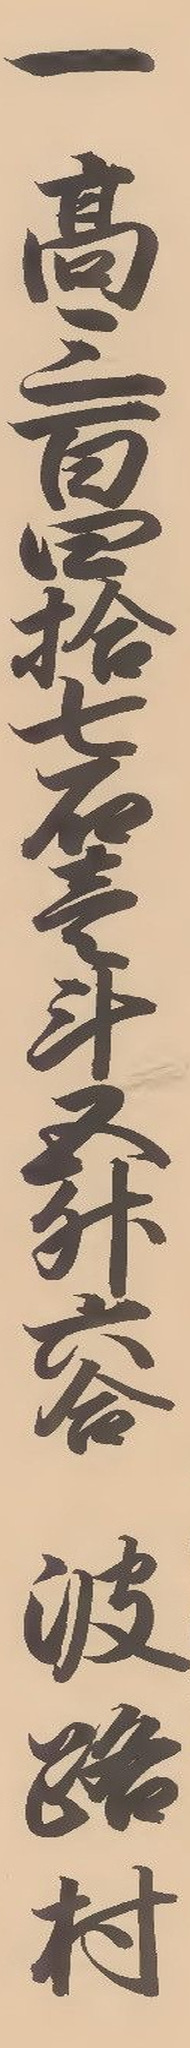一高三百四拾七石壱斗五升六合波路村
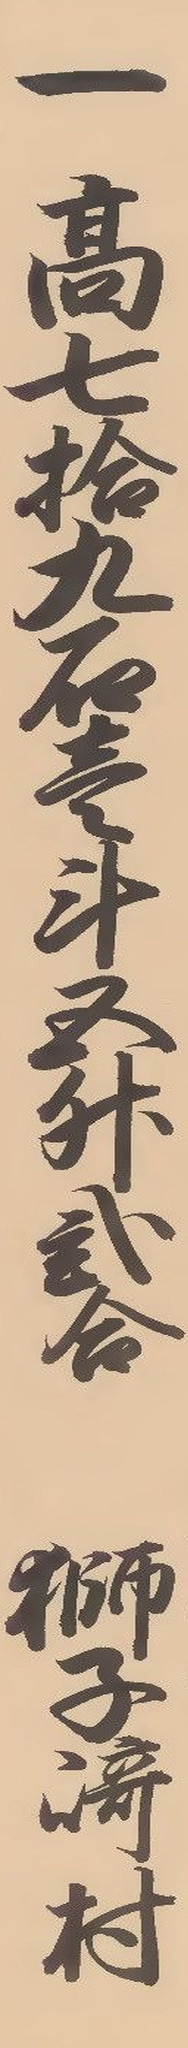一高七拾九石壱斗五升弐合獅子崎村
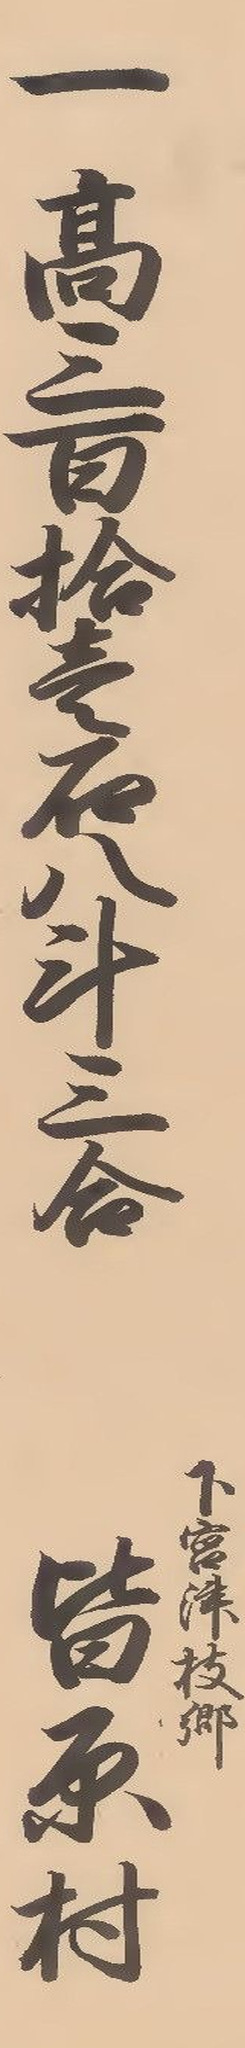一高三百拾壱石八斗三合皆原村
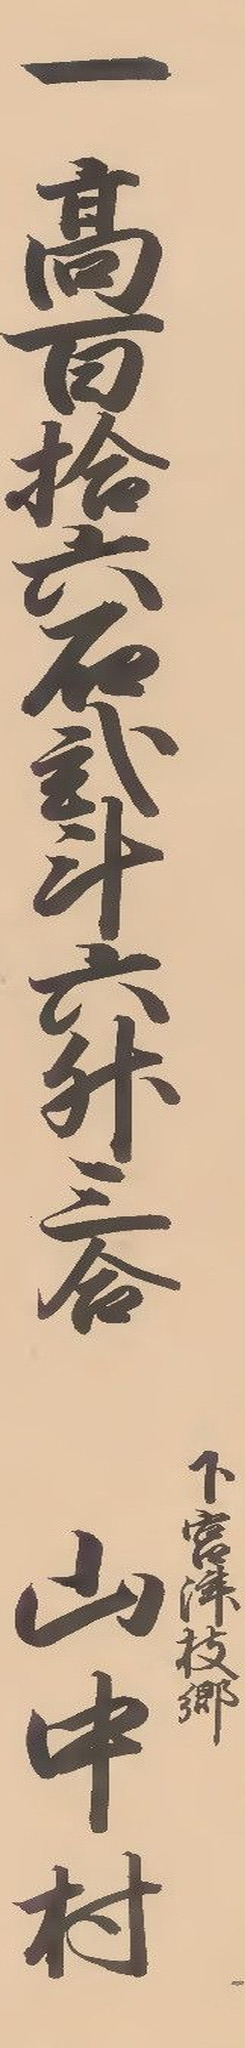一高百拾六石弐斗六升三合山中村
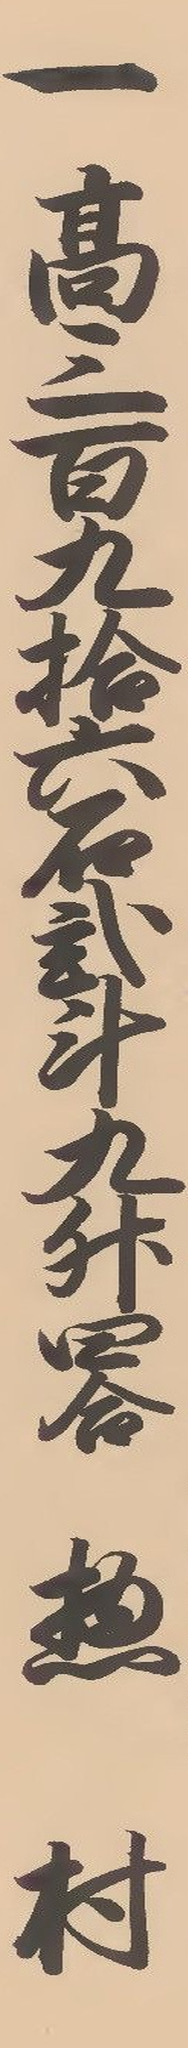一高三百九拾六石弐斗九升四合惣村
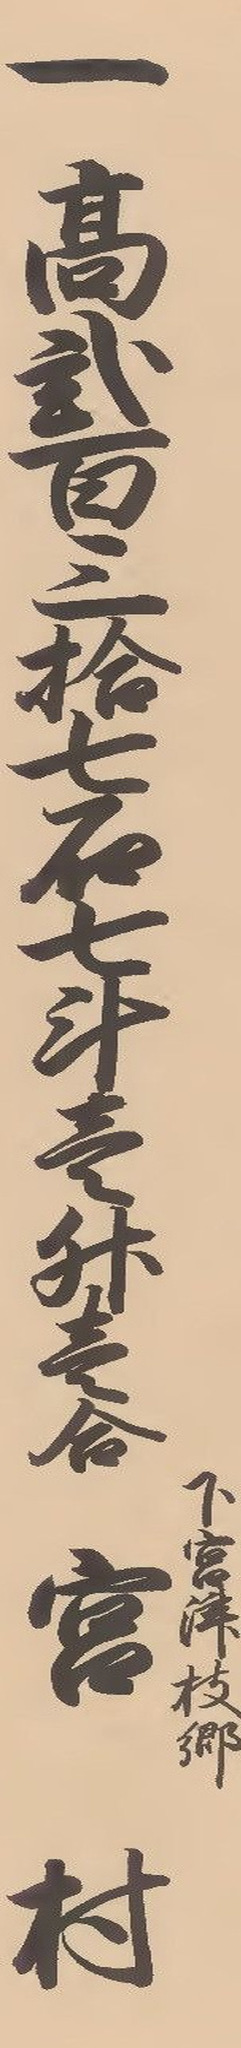一高弐百三拾七石七斗壱升壱合宮村
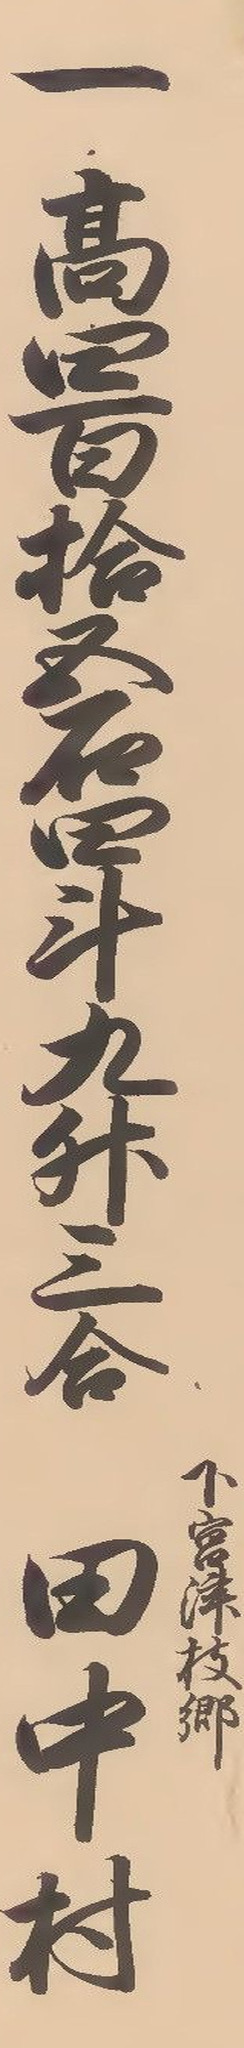一高四百拾五石四斗九升三合田中村
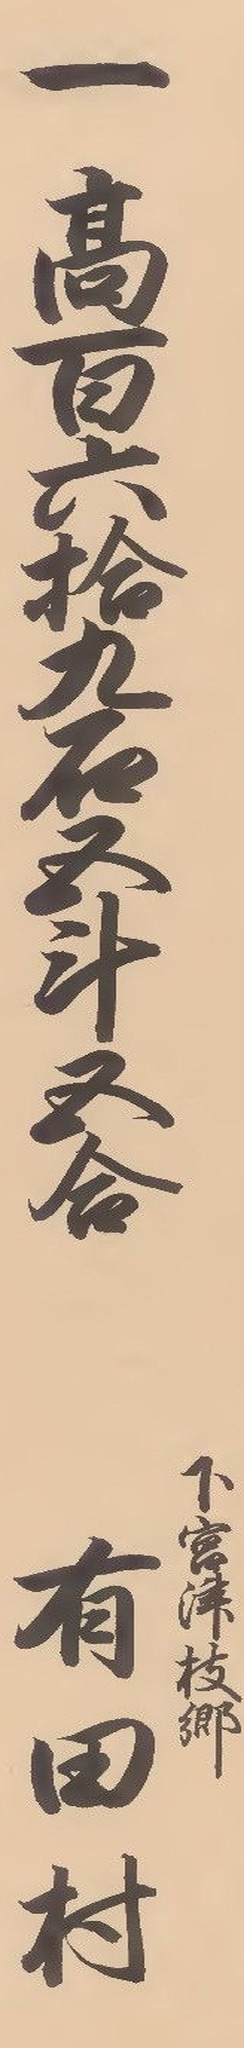一高百六拾九石五斗五合有田村

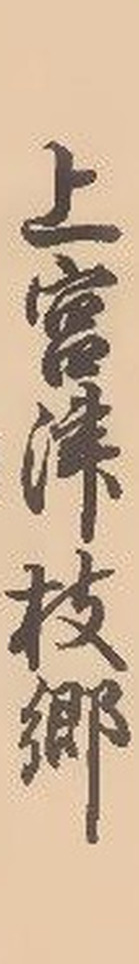上宮津枝郷
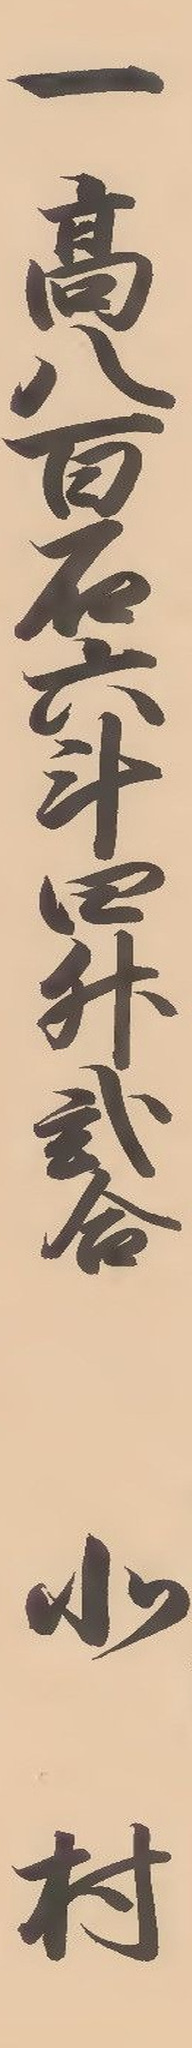一高八百石六斗四升弐合北村
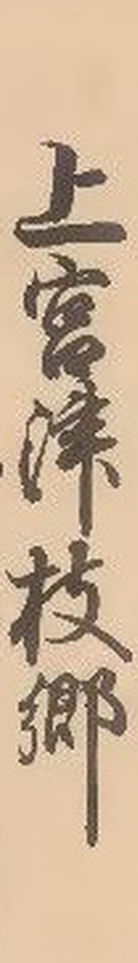上宮津枝郷
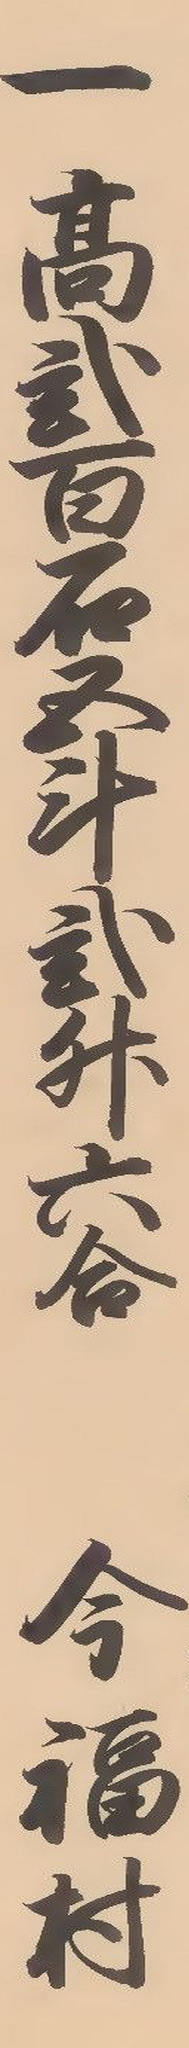一高弐百石五斗弐升六合今福村
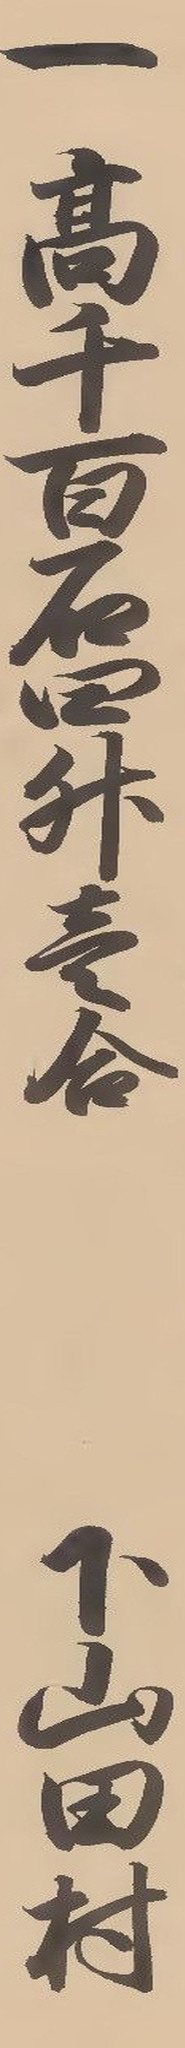一高千百石四升壱合下山田村
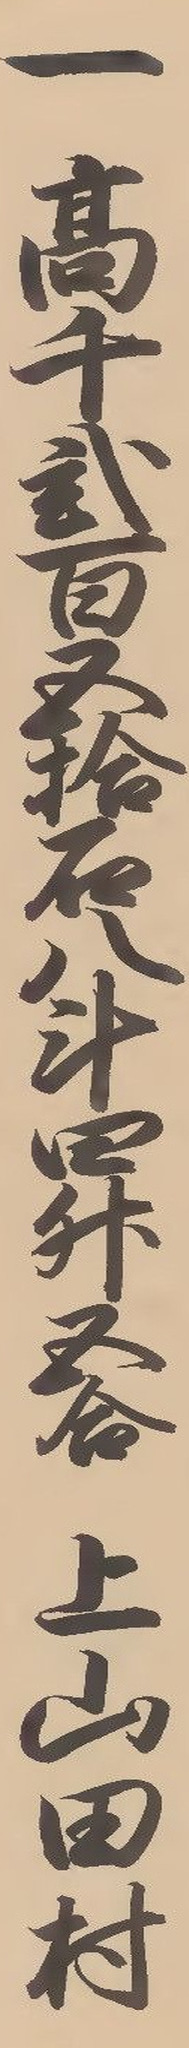一高千弐百五拾石八斗四升五合上山田村
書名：丹後国郷帳
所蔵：国立公文書館 National Archives of Japan
